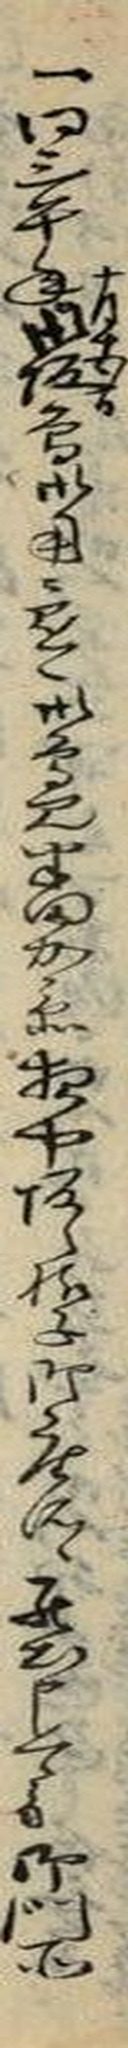一同三午年十月十五日御坂鳥御用に懸候御鳥見半田加兵衛夜中坂之様子御座所へ罷出申上候に付御門所
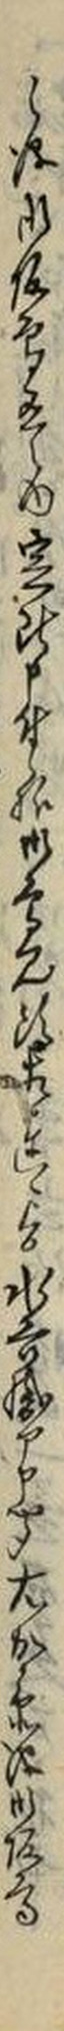之儀御坂鳥有之内定断申付候様御鳥見頭相達候旨水谷織部申聞右加兵衛儀御坂鳥
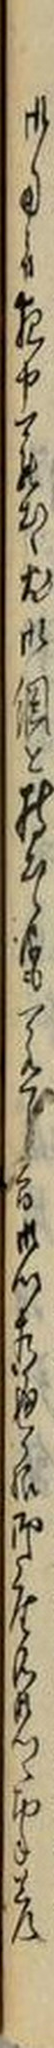御用に付夜中可罷出候尤御網を持出候儀も可有之候間御門相通候様御座所御門へ切手差
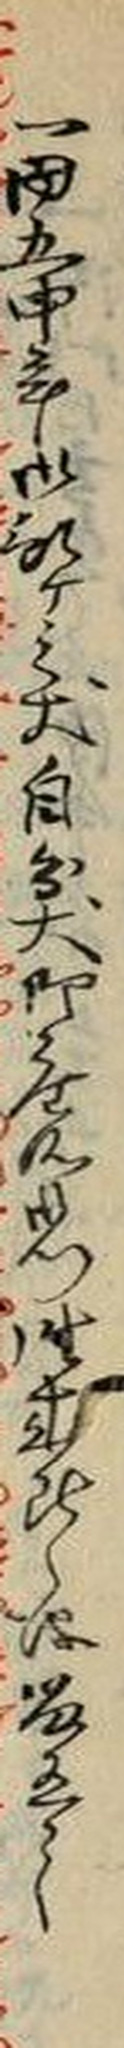一同五申年御預ケ之犬自分犬御座所御門往来断之儀留有之
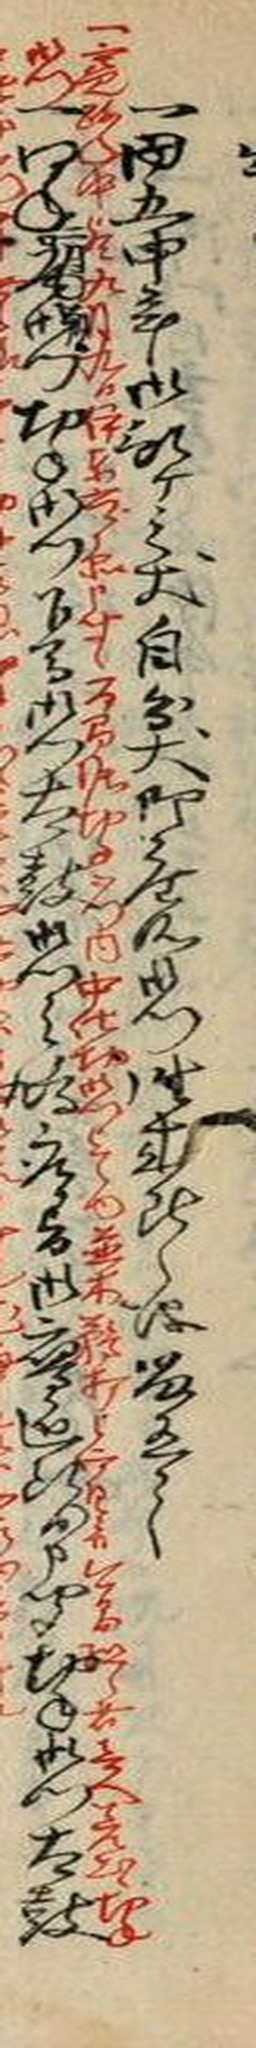一同年二月朔日瓦御門切手御門下馬御門太鼓御門之鳩取候旨御鷹匠頭ゟ申聞切手太鼓
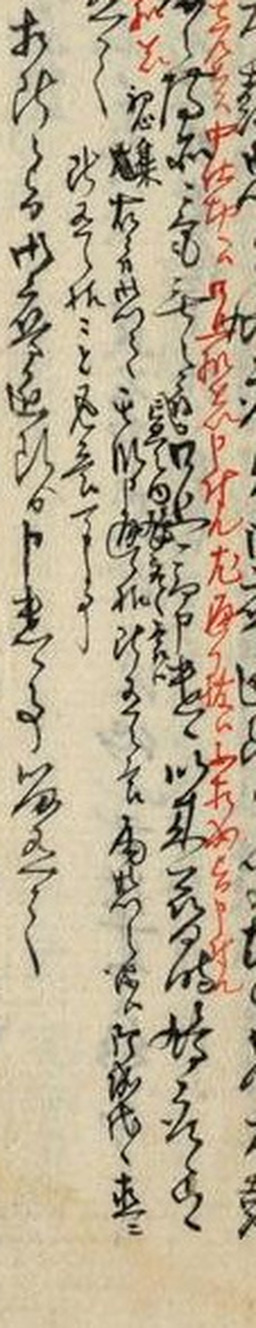右に付御門ニて其段申通候様断有之節瓦御門之儀は御城代へ直に
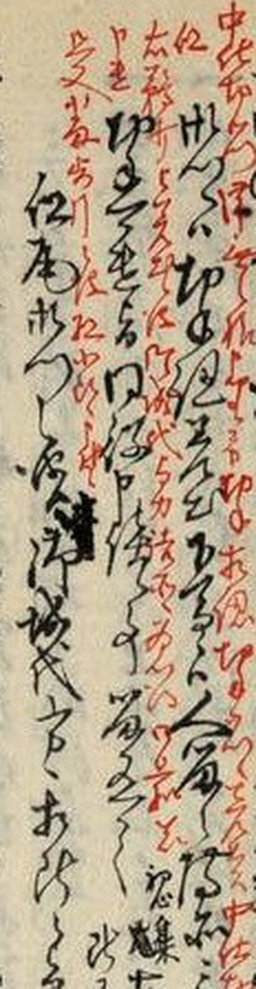切手可遣旨同役申談候事留有之
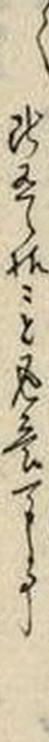断有之候様にと返答可申候事
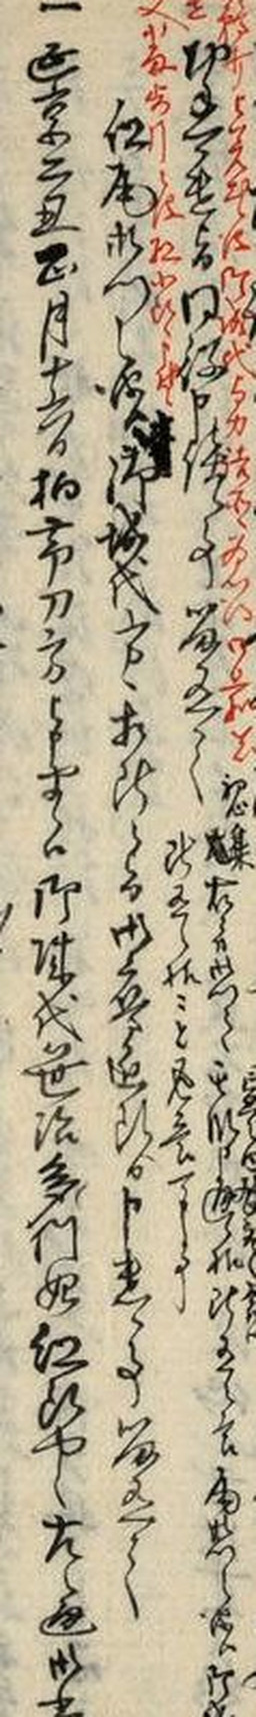但瓦御門之儀は御城代方へ相断候旨御鷹匠頭ゟ申遣候事留有之
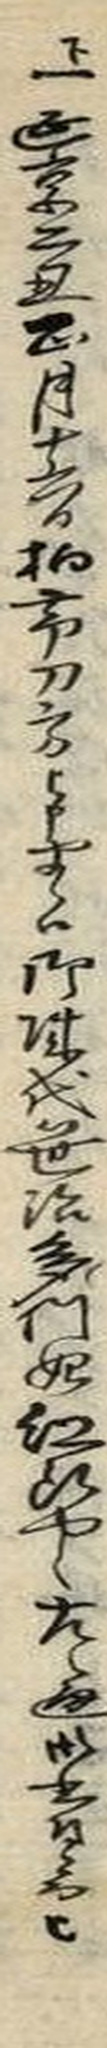下一延享二丑正月十六日狛帯刀方被申聞候は御城代笹治多門始組頭中へ左之通書付ニ而被
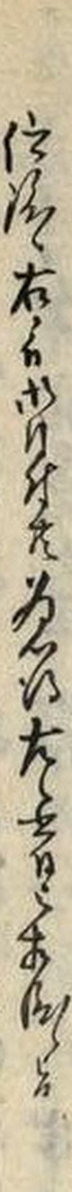仰渡候右に付御目付共為心得左之書付被相渡候旨
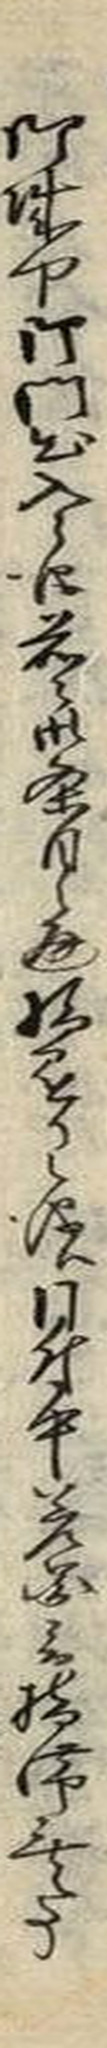御城中御門出入之儀前々御条目之通指懸り之儀は目付中差図に而指滞無之候事
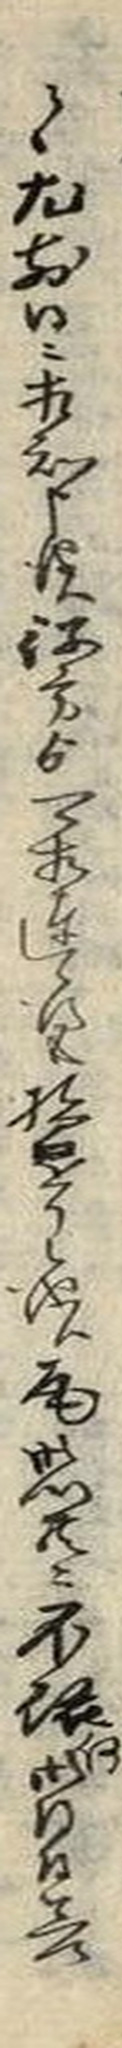に候尤前日に相知申儀は役方ゟ可相達候得共指懸り之儀は瓦御門共に不依何御目付差
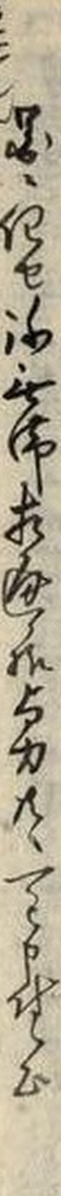図に任せ弥無滞相通候様与力共へ可被申付候以上
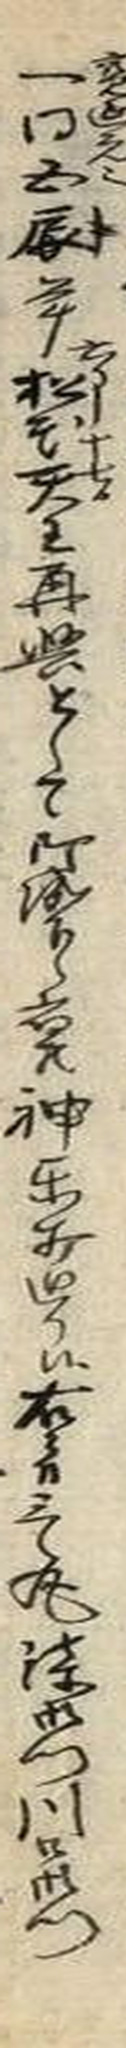一同五辰年六月十七日松本天王再興として御城下之者共神楽打廻り候右に付三之丸漆御門川口御門
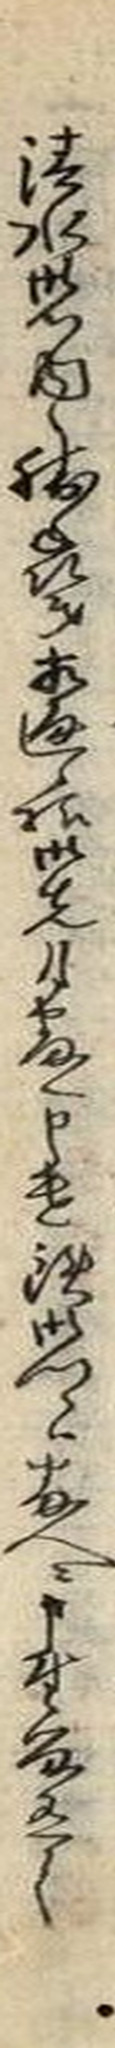清水御門内之勝手次第相通候様御先月番へ申遣鉄御門へは番人に申付留有之
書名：御門御櫓之部
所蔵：福井県文書館 Fukui Prefectural Archives
